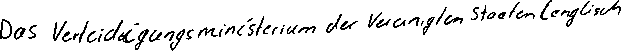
Das Verteidigungsministerium der Vereinigten Staaten (englisch
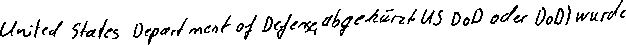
United States Department of Defense, abgekürzt US DoD oder DoD) wurde
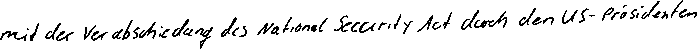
mit der Verabschiedung des National Security Act durch den US-Präsidenten
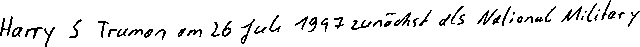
Harry S. Truman am 26. Juli 1947 zunächst als National Military
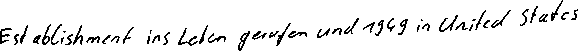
Establishment ins Leben gerufen und 1949 in United States
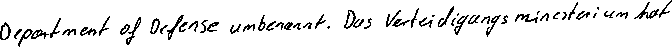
Department of Defense umbenannt. Das Verteidigungsministerium hat
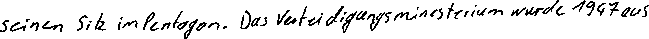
seinen Sitz im Pentagon. Das Verteidigungsministerium wurde 1947 aus
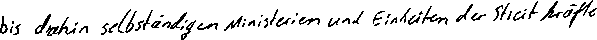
bis dahin selbständigen Ministerien und Einheiten der Streitkräfte
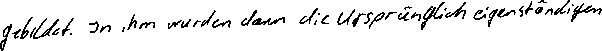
gebildet. In ihm wurden dann die ursprünglich eigenständigen
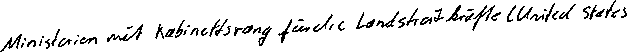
Ministerien mit Kabinettsrang für die Landstreitkräfte (United States
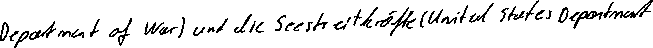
Department of War) und die Seestreitkräfte (United States Department
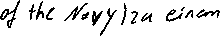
of the Navy) zu einem
